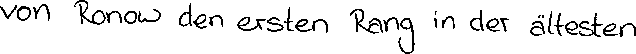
von Ronow den ersten Rang in der ältesten
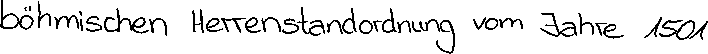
böhmischen Herrenstandordnung vom Jahre 1501
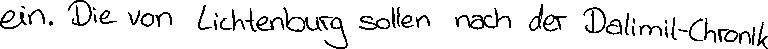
ein. Die von Lichtenburg sollen nach der Dalimil-Chronik
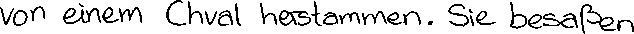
von einem Chval herstammen. Sie besaßen
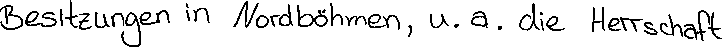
Besitzungen in Nordböhmen, u. a. die Herrschaft
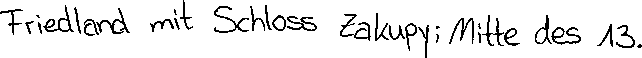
Friedland mit Schloss Zakupy; Mitte des 13.
